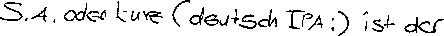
S.A. oder kurz (deutsch IPA: ) ist der
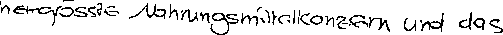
weltgrösste Nahrungsmittelkonzern und das
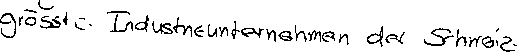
grösste Industrieunternehmen der Schweiz.
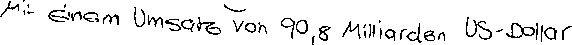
Mit einem Umsatz von 90,8 Milliarden US-Dollar
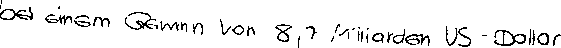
bei einem Gewinn von 8,7 Milliarden US-Dollar
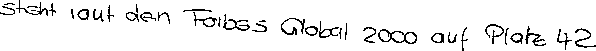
steht laut den Forbes Global 2000 auf Platz 42
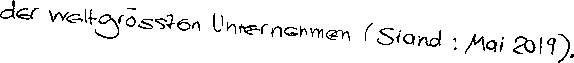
der weltgrössten Unternehmen (Stand: Mai 2019).
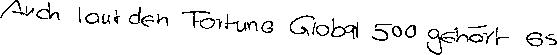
Auch laut den Fortune Global 500 gehört es
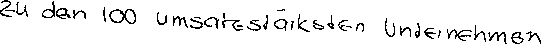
zu den 100 umsatzstärksten Unternehmen
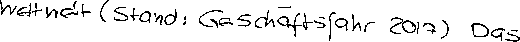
weltweit (Stand: Geschäftsjahr 2017). Das
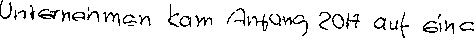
Unternehmen kam Anfang 2017 auf eine
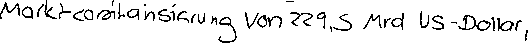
Marktkapitalisierung von 229,5 Mrd. US-Dollar,
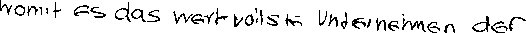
womit es das wertvollste Unternehmen der
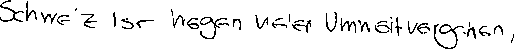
Schweiz ist. Wegen vieler Umweltvergehen,
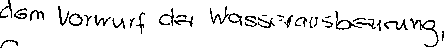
dem Vorwurf der Wasserausbeutung,
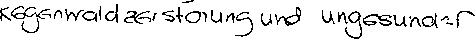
Regenwaldzerstörung und ungesunder
